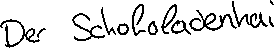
Der Schokoladenhai
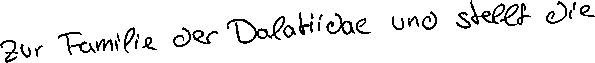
zur Familie der Dalatiidae und stellt die
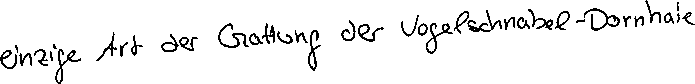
einzige Art der Gattung der Vogelschnabel-Dornhaie
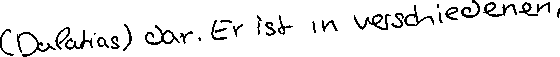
(Dalatias) dar. Er ist in verschiedenen,
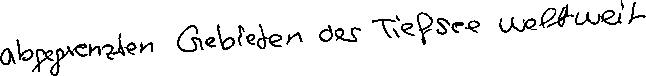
abgegrenzten Gebieten der Tiefsee weltweit
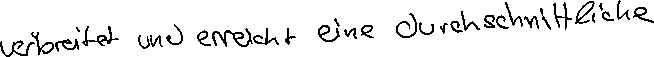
verbreitet und erreicht eine durchschnittliche
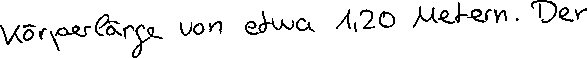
Körperlänge von etwa 1,20 Metern. Der
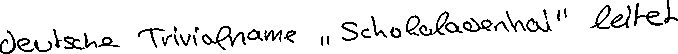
deutsche Trivialname "Schokoladenhai" leitet
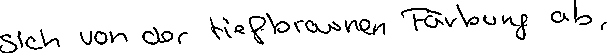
sich von der tiefbraunen Färbung ab,
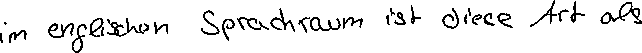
im englischen Sprachraum ist diese Art als
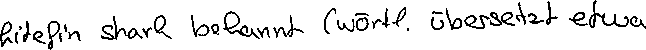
kitefin shark bekannt (wörtl. übersetzt etwa
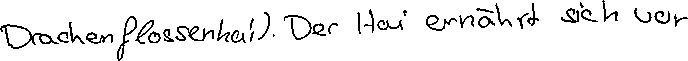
Drachenflossenhai). Der Hai ernährt sich vor
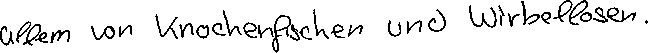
allem von Knochenfischen und Wirbellosen.
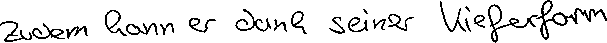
Zudem kann er dank seiner Kieferform
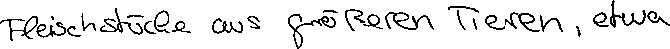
Fleischstücke aus größeren Tieren, etwa
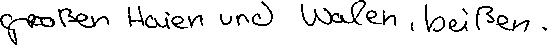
großen Haien und Walen, beißen.
